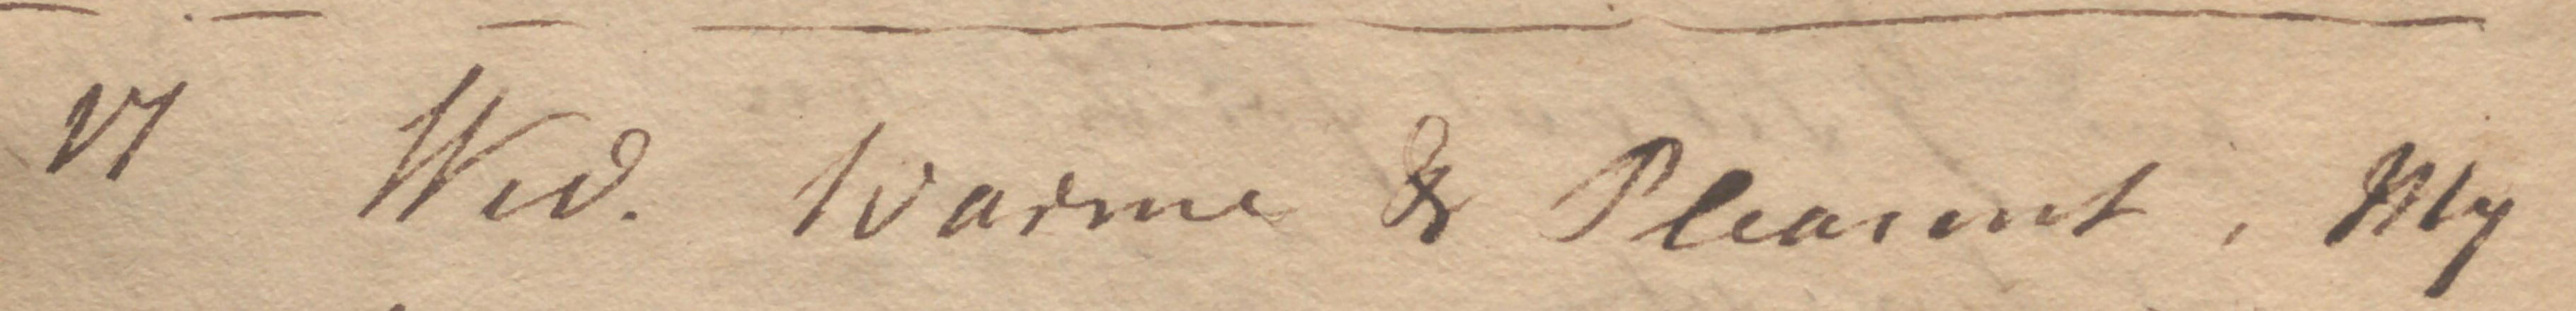17 Wed. Warme & Pleasent. My
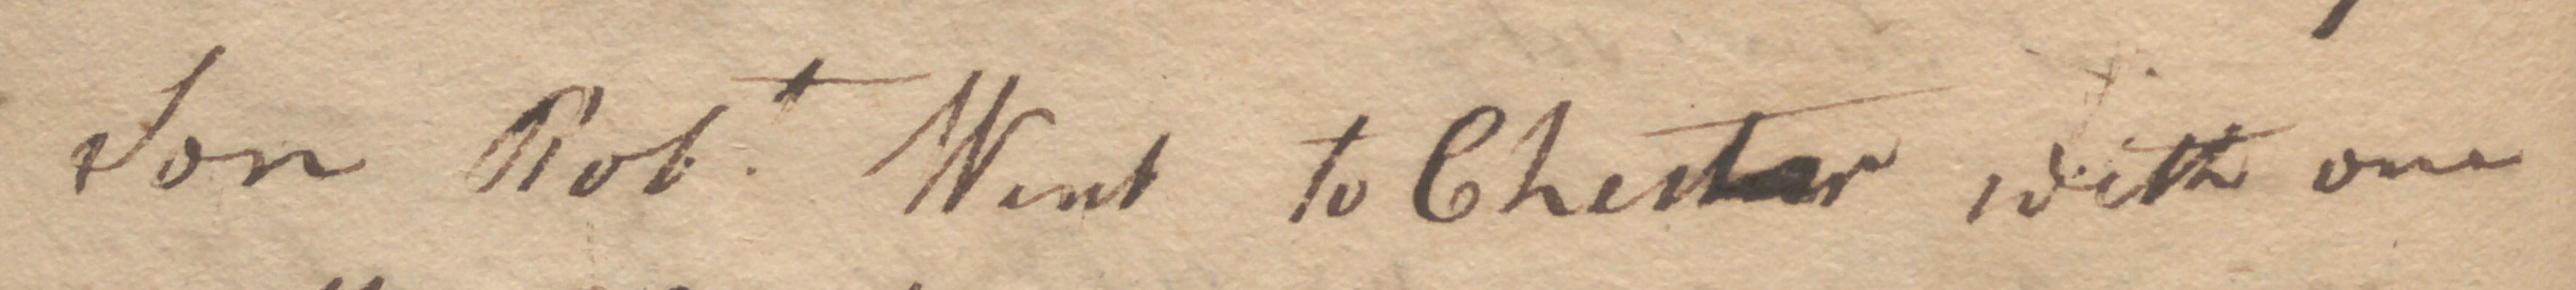Son Rob^t. Went to Chester with one
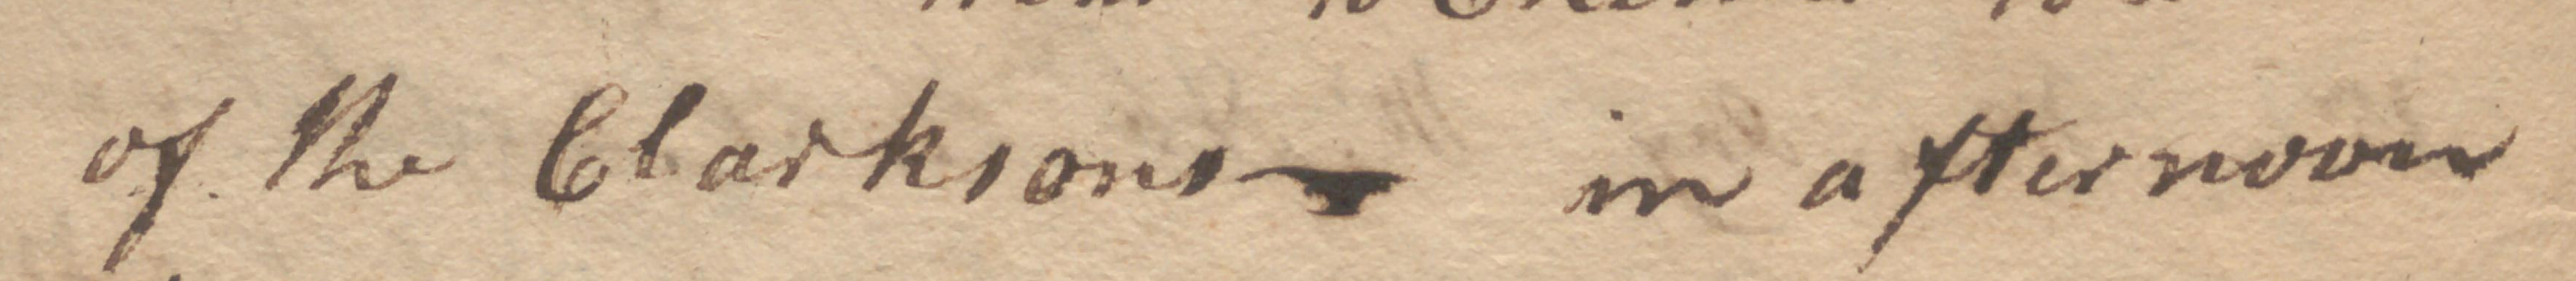of the Clarksons- in afternoon
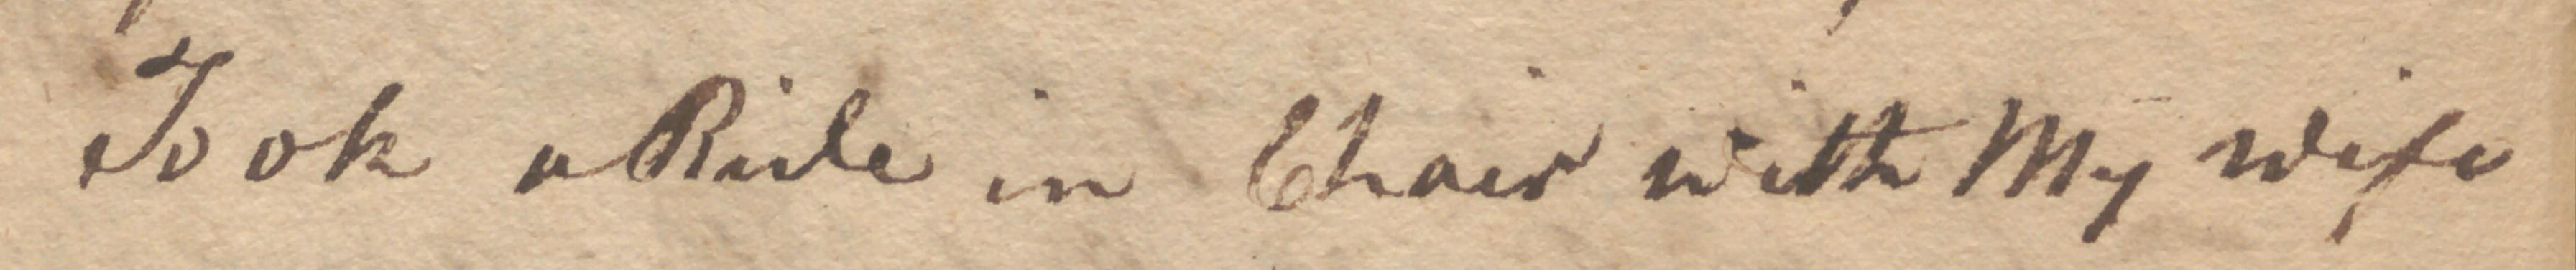Took a Ride in Chair with My wife
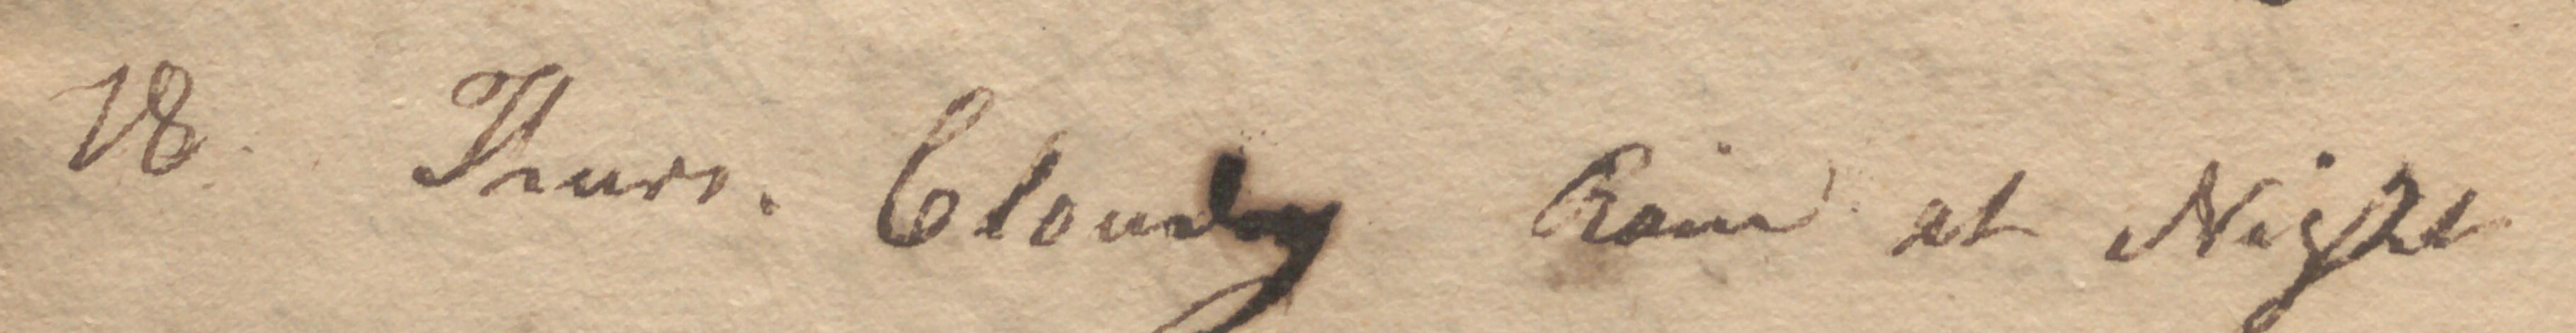18. Thurs. Cloudy Rain at Night
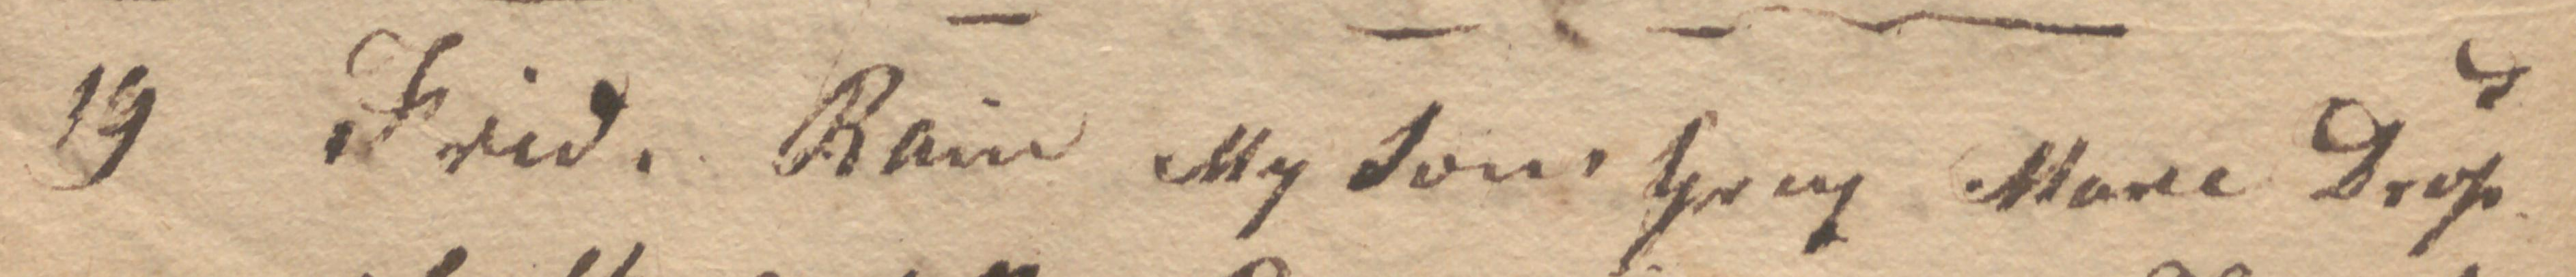19 Frid. Rain My sons Grey Mare Drop^d
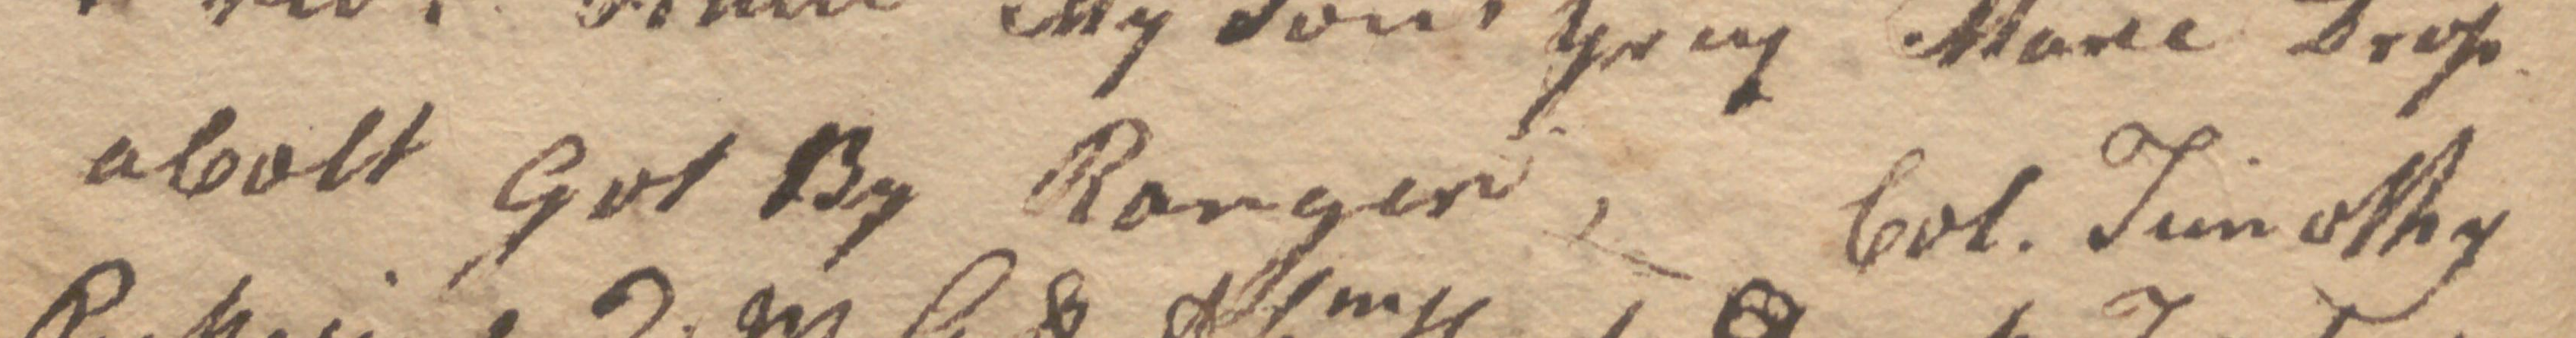a Colt Got By Ranger, Col. Timothy
